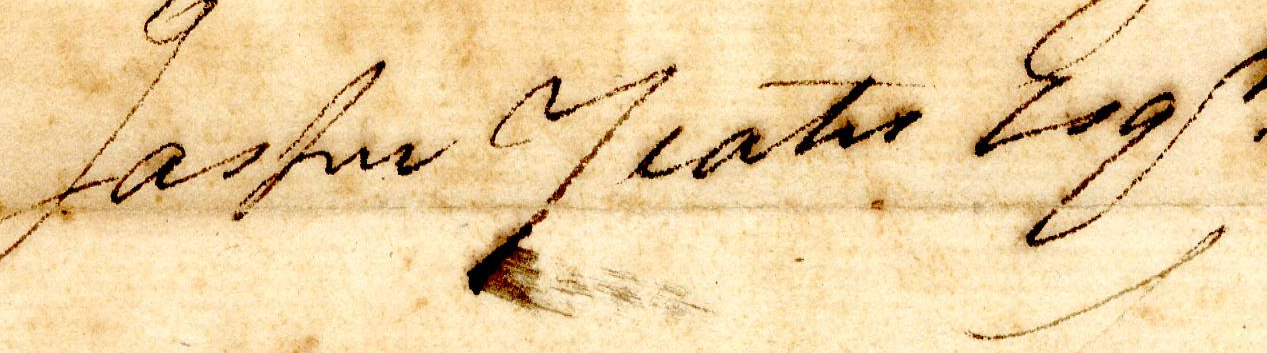Jasper Yeates Esq^r
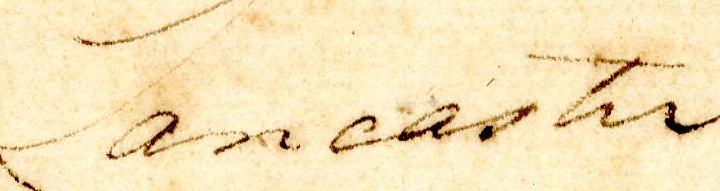Lancaster
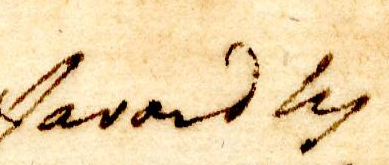favord by
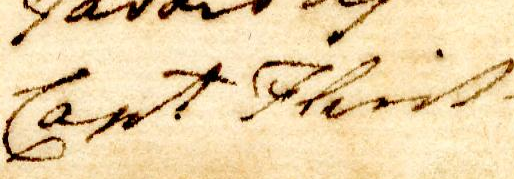Capt Flint
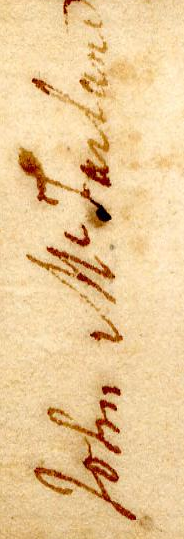John Mc.Farlane
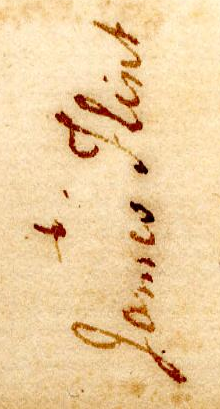James Flint
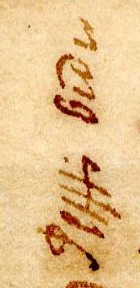Pltff's Order
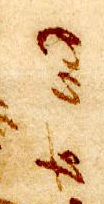to end
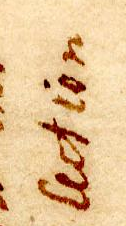Action
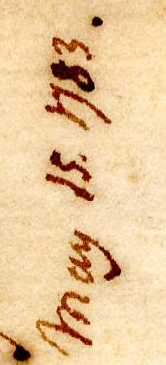May 15. 1783.
